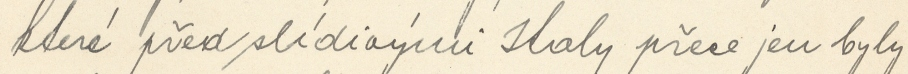které před slídivými Italy přece jen byly
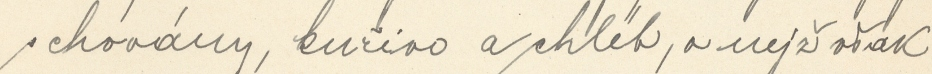schovány, kuřivo a chléb, o nejž však
